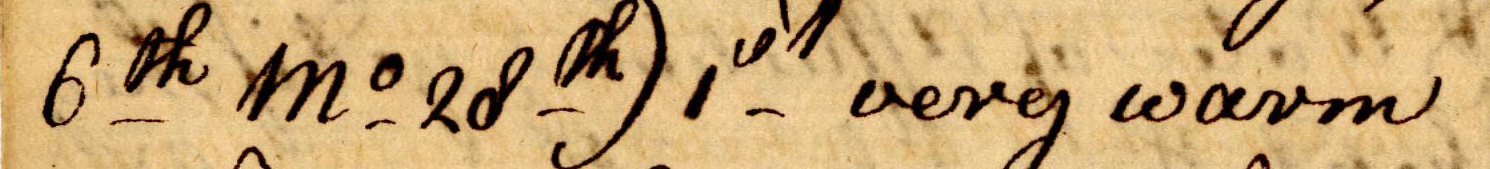6^th M^o 28^th) 1^st very warm
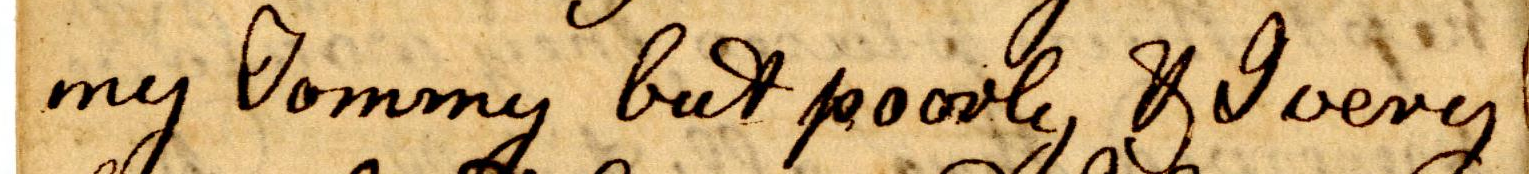my Tommy but poorly & I very
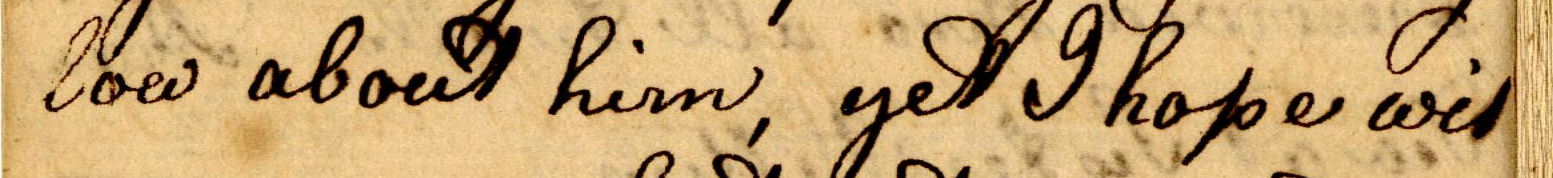low about him yet I hope wit
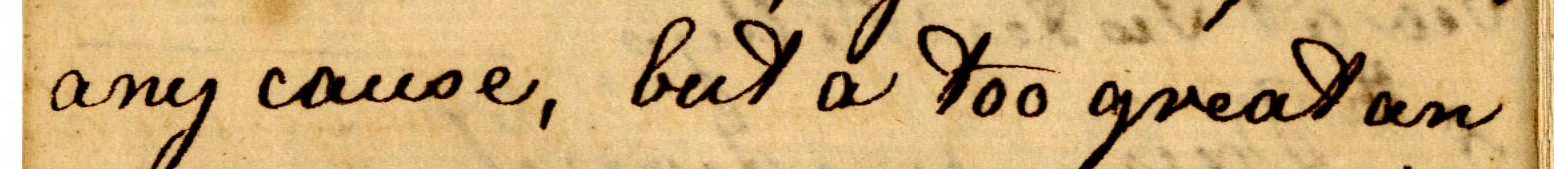any cause, but a too great an
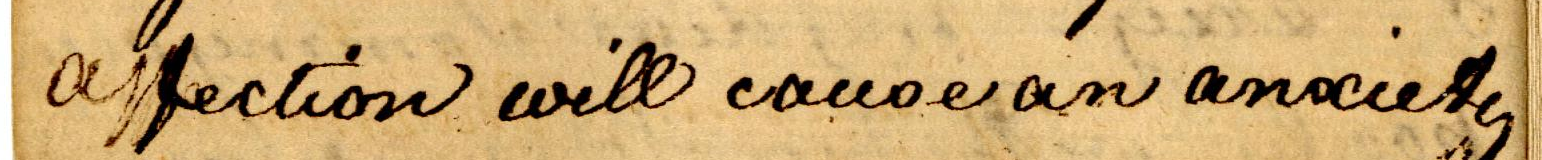Affection will cause an anxiety
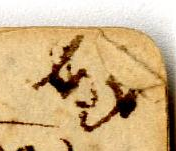4[_]
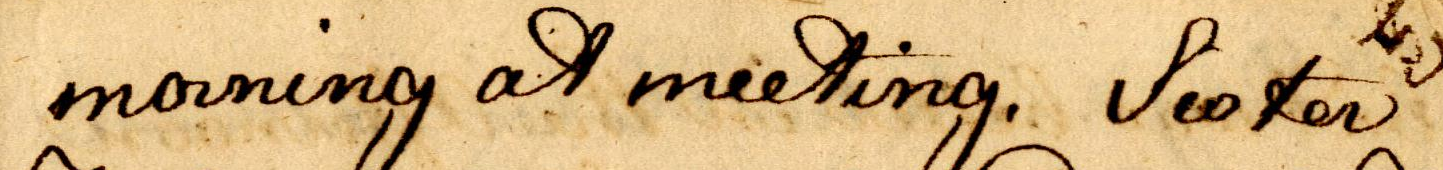morning at meeting, Sister
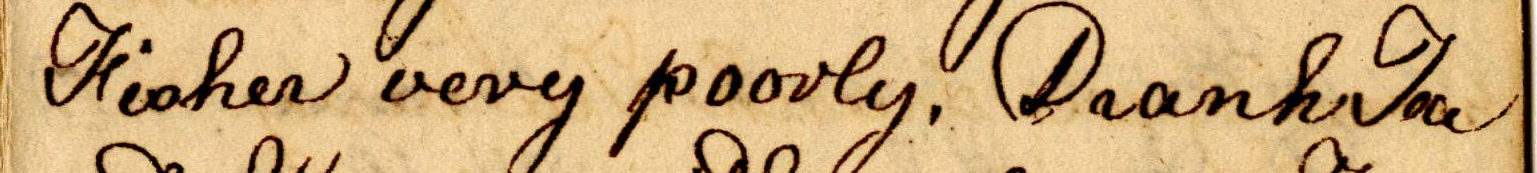Fisher very poorly, Drank Tea
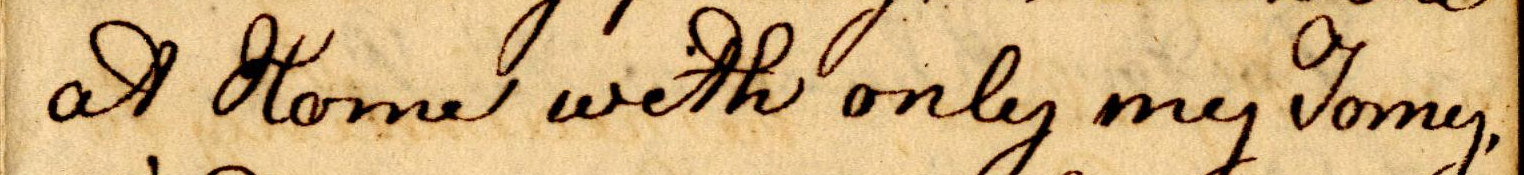at Home with only my Tomy,
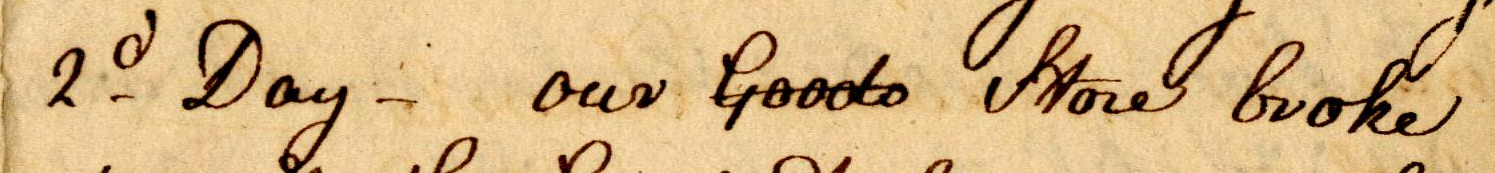2^d. Day- our Goods Store broke
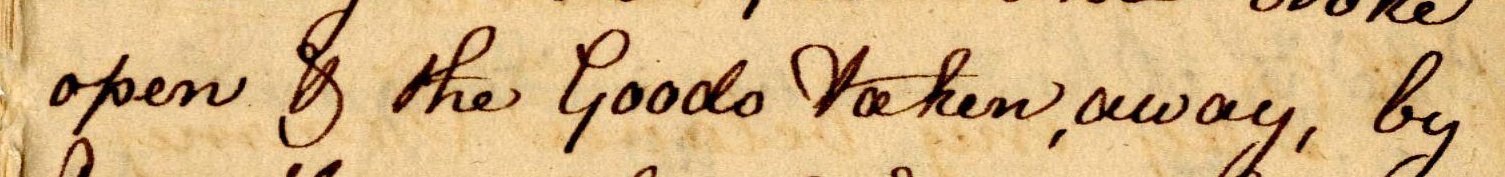open & the Goods taken away, by
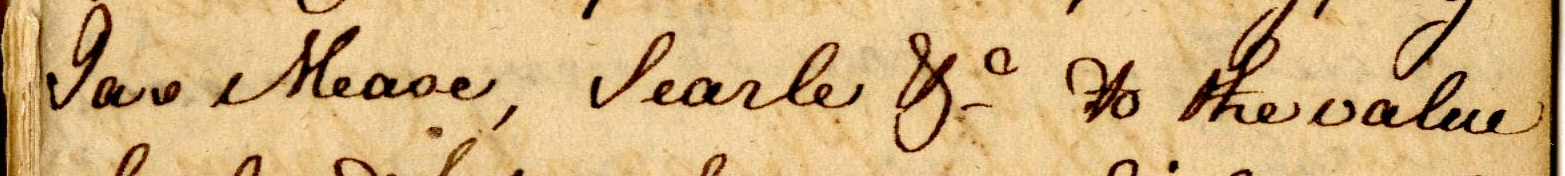Ias Mease. Searle &^c to the value
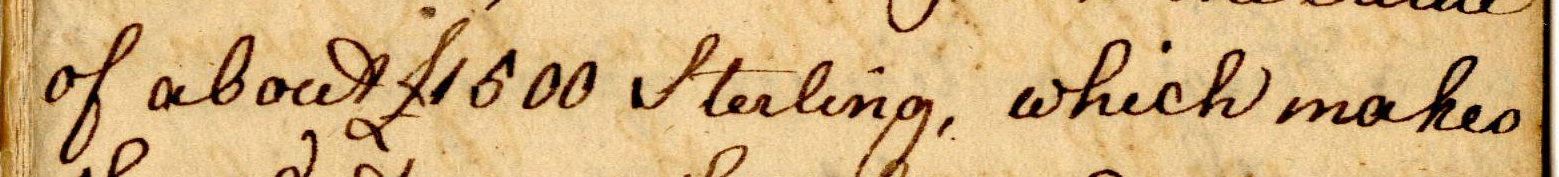of about £1500 Sterling, which makes
